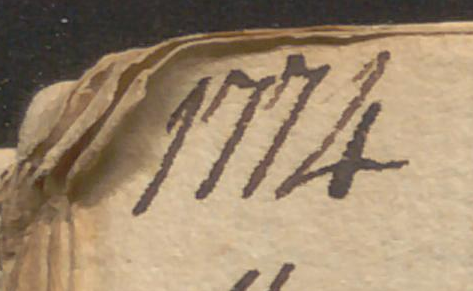1774
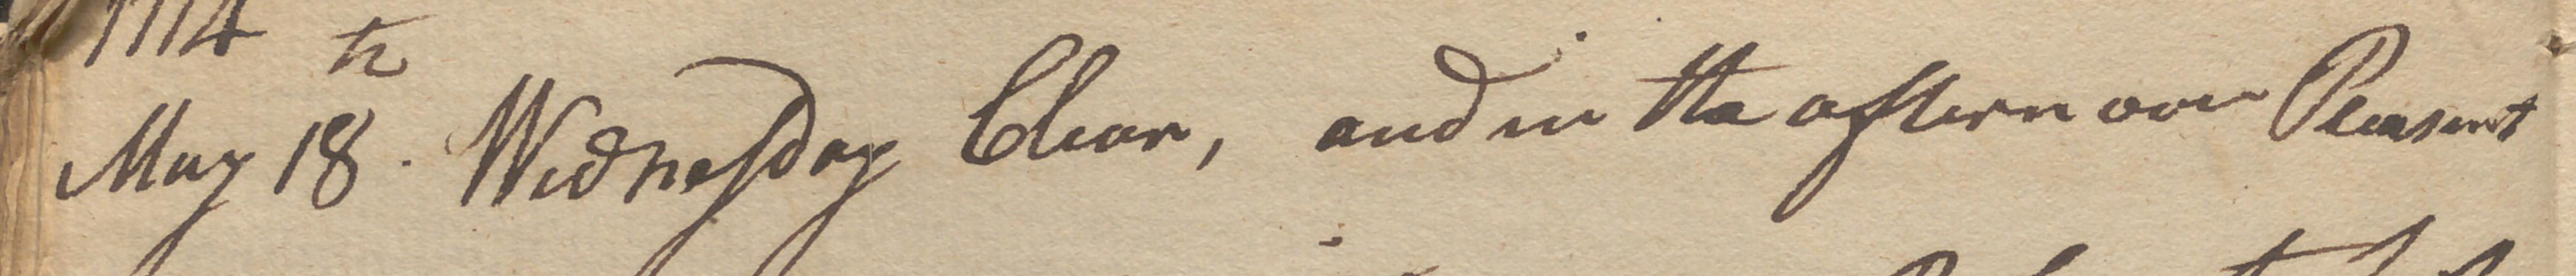May 18^th. Wednesday Clear, and in the afternoon Pleasent
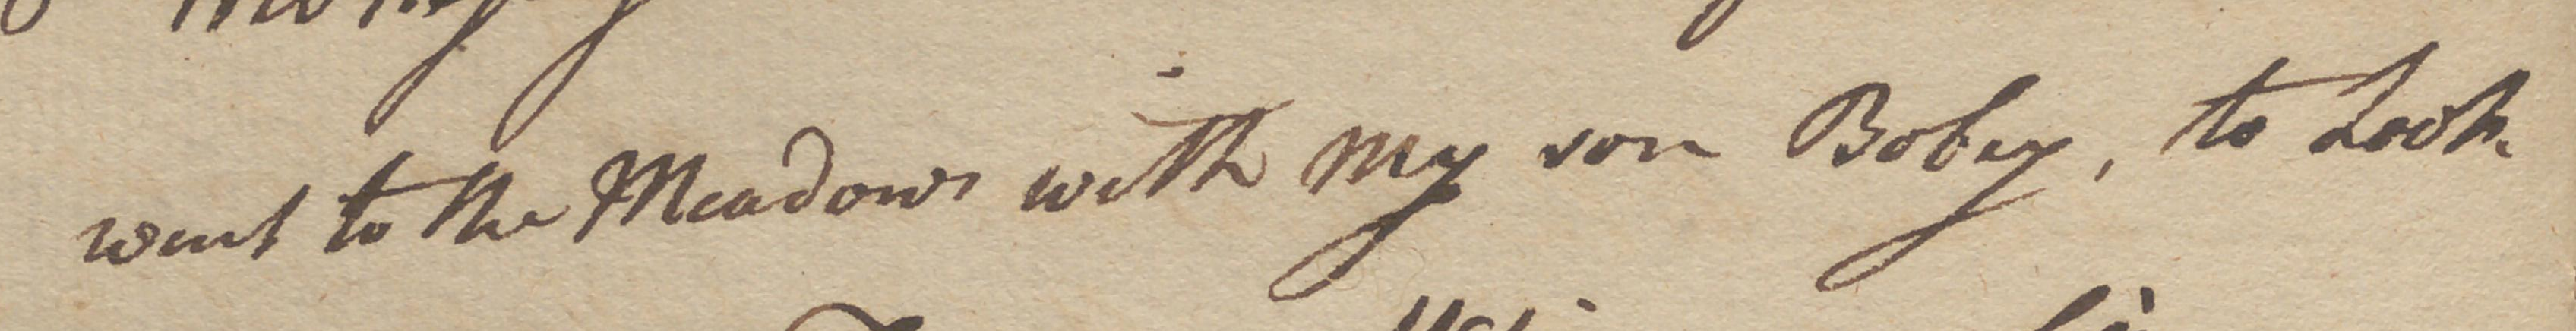went to the Meadows with my son Bobey, to Look
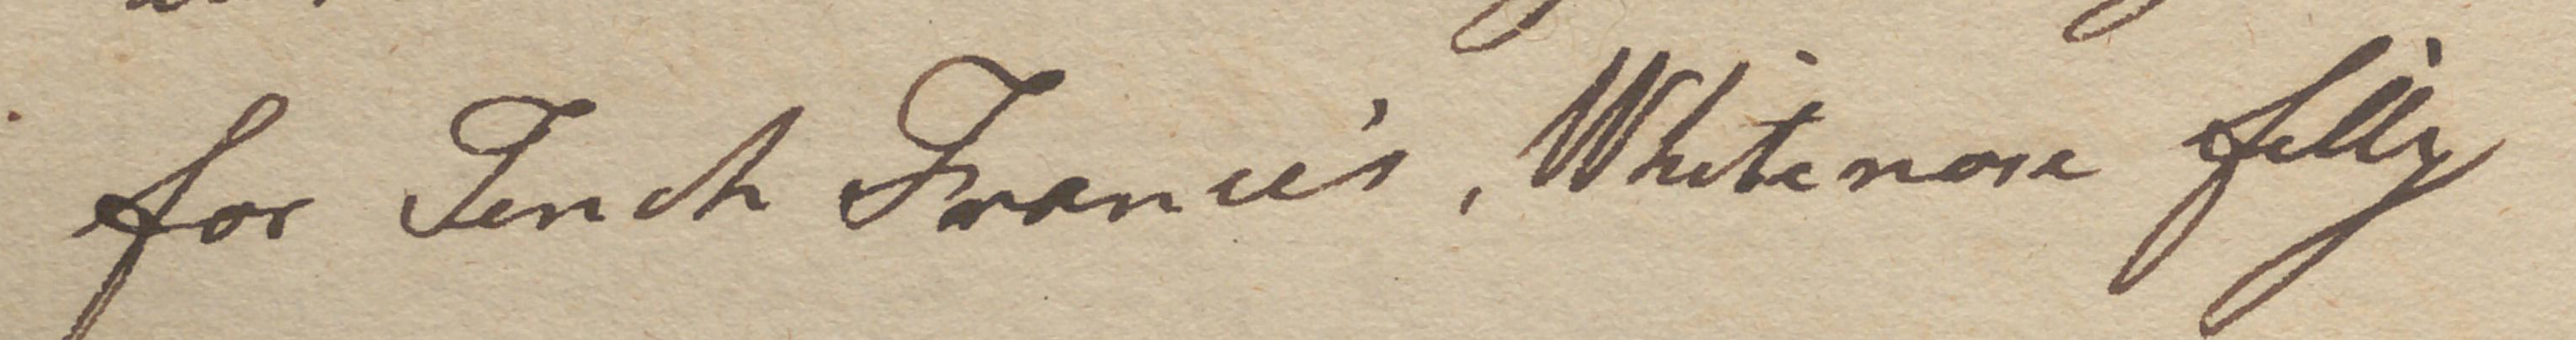for Tench France's, Whitenose filly
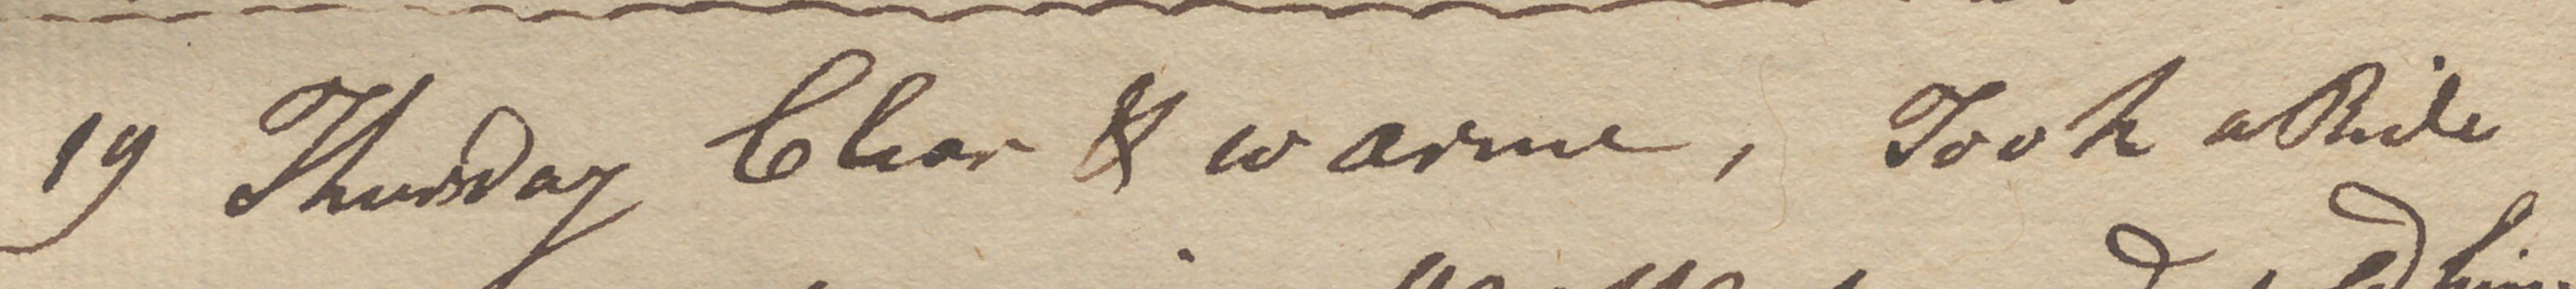19 Thurday Clear & warme, Took a Ride
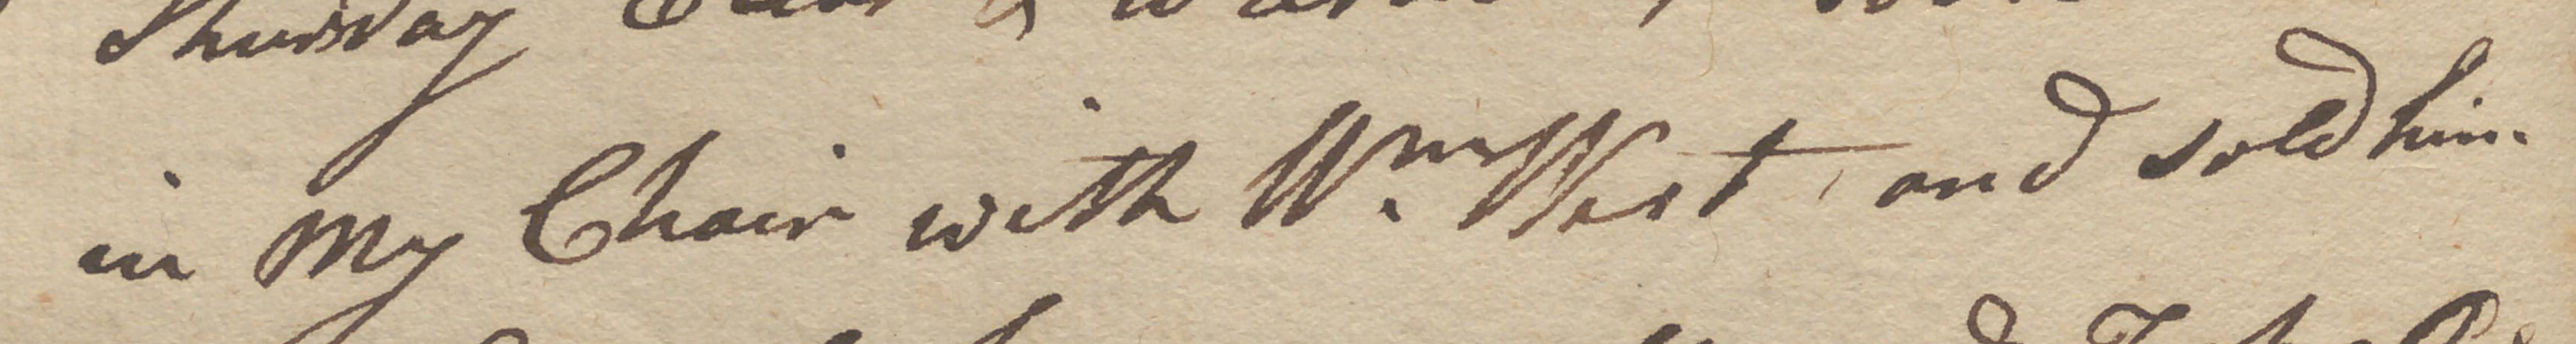in My Chair with W^m. Wist, and sold him
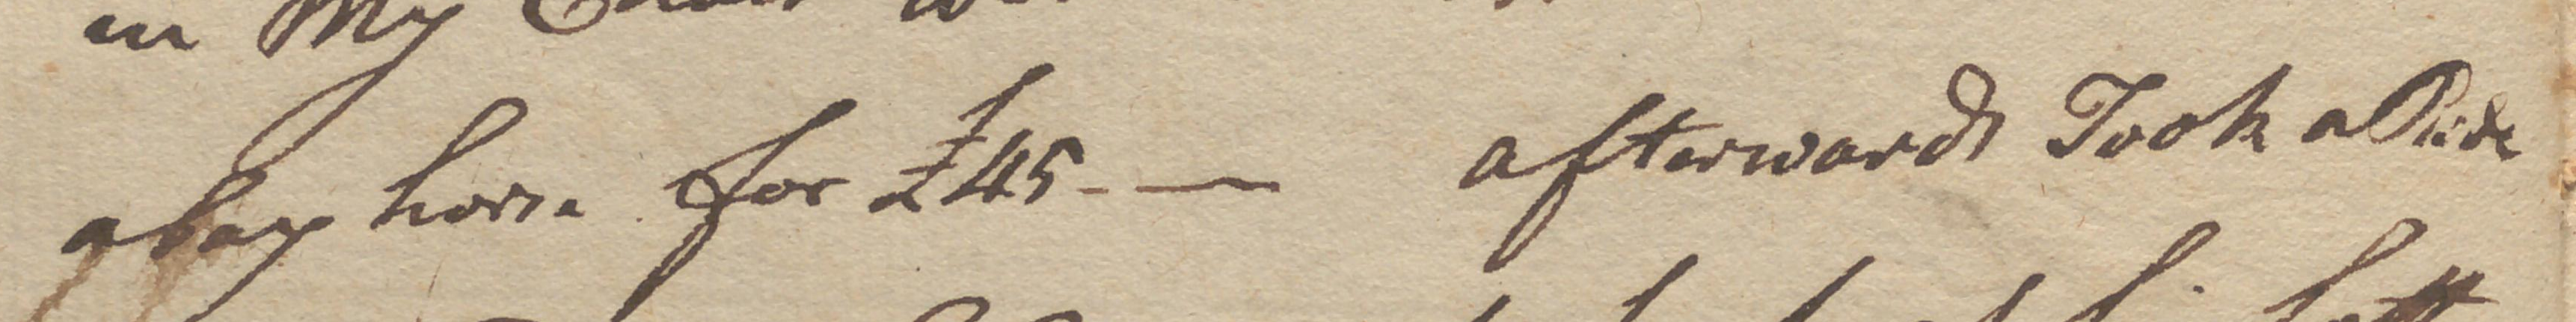a bay horse for £45.- afterwards Took a Ride
